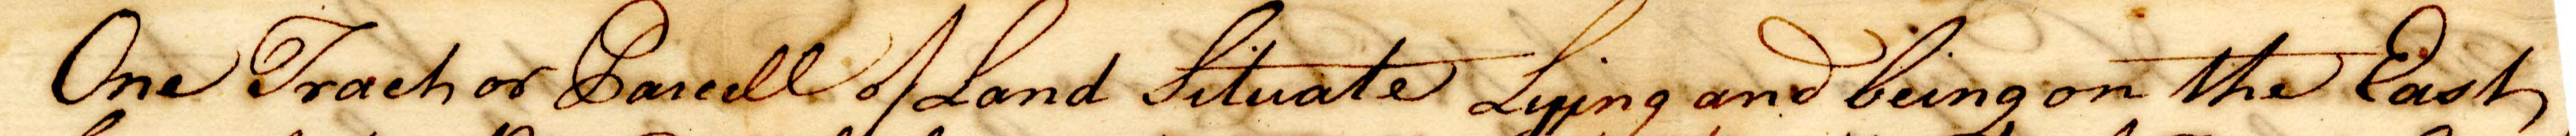One Tract or Parcell of Land situate laying and being on the East
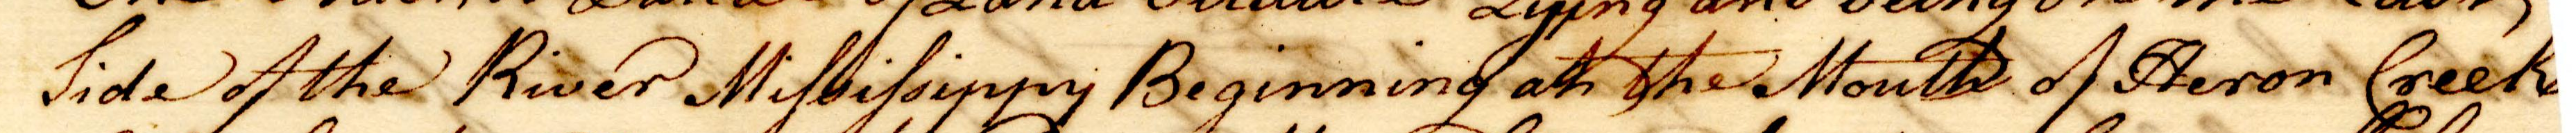Side of the River Mississippy Beginning at the Mouth of Heron Creek
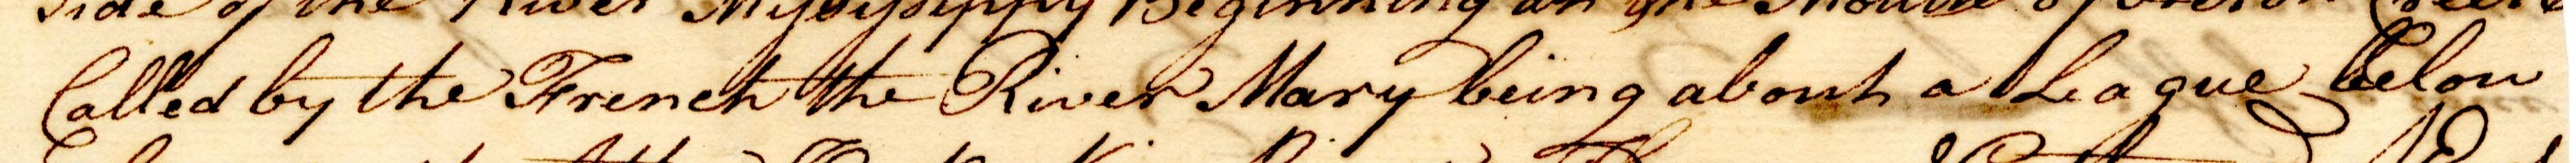Called by the French the River Mary being about a league below
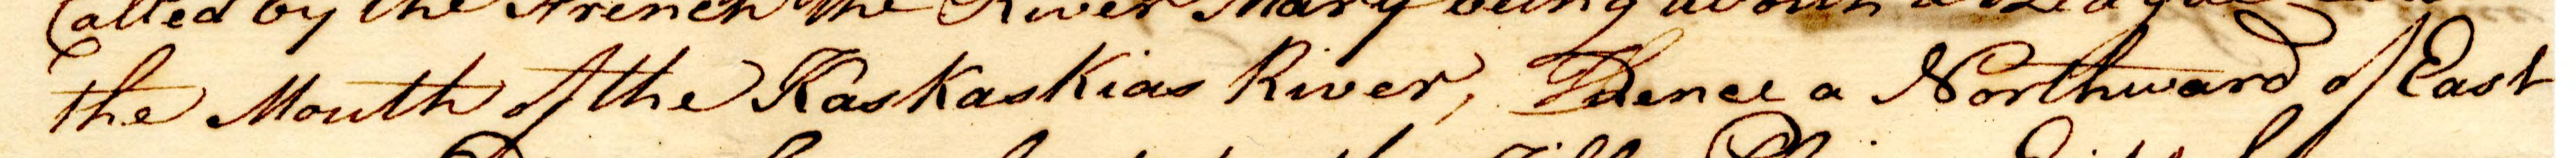the Mouth of the Kaskaskias River, thence a Northward of East
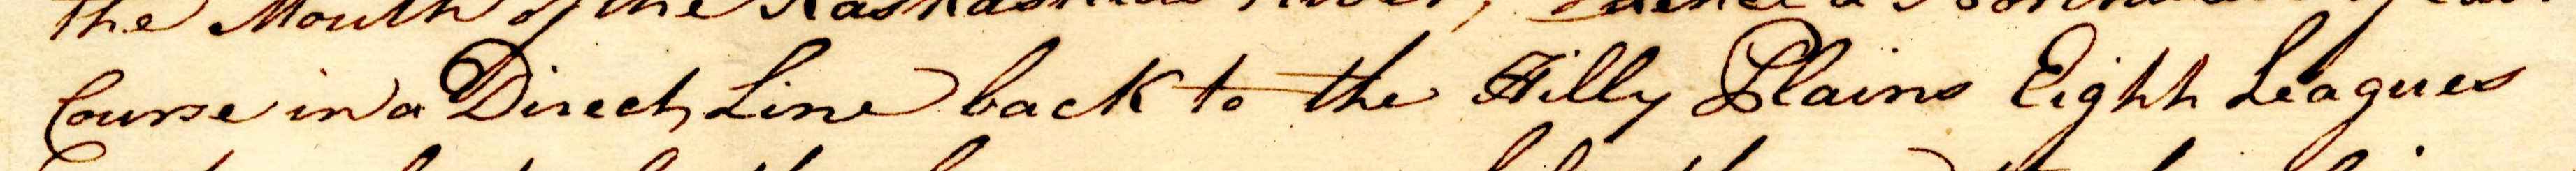Course in a Direct Line back to the Hilly Plains Eight Leagues
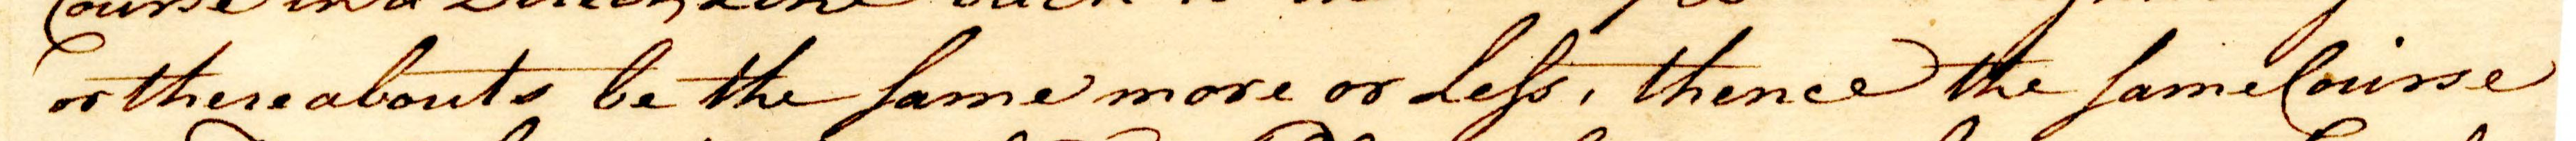or thereabouts be the same more or less, thence the same Course
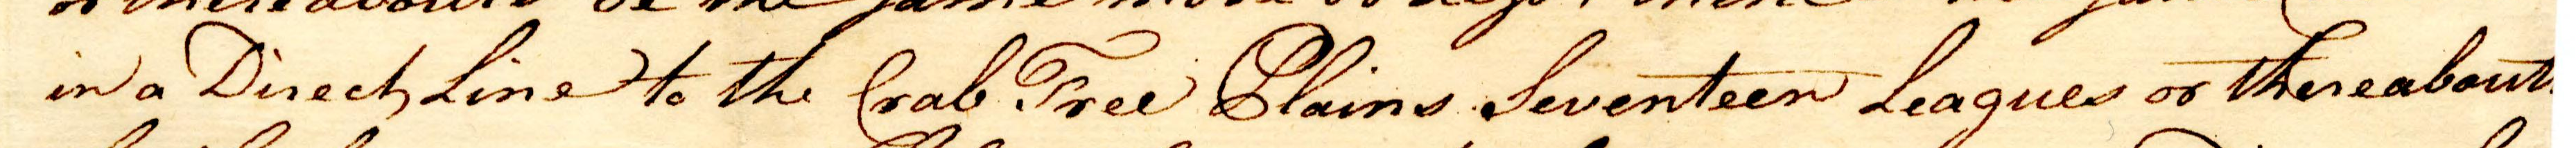in a Direct Line to the Crab Tree Claims Seventeen Leagues or thereabout
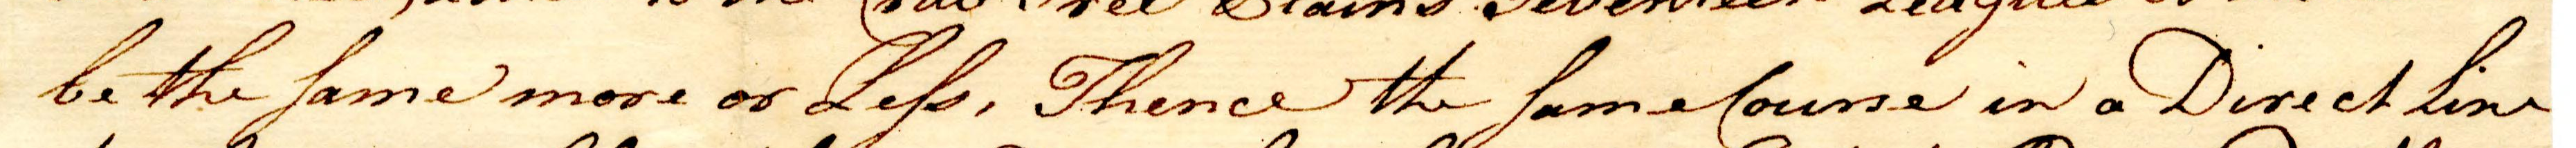be the same more or less, Thence the same Course in a Direct Line
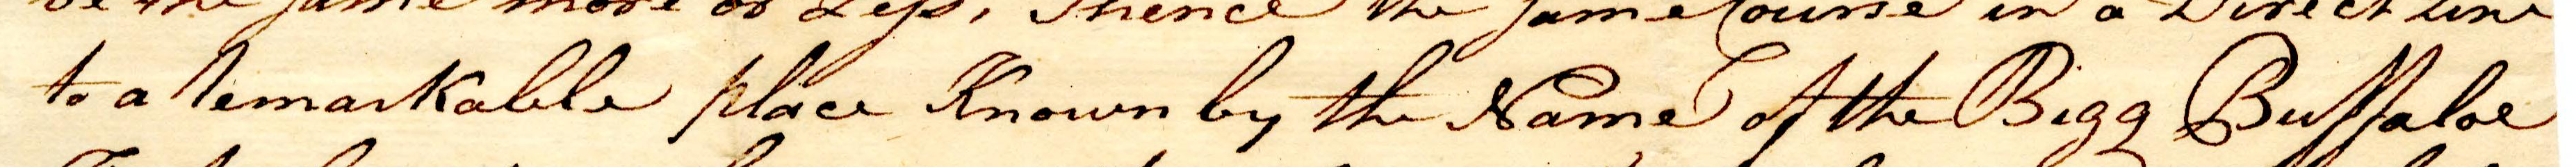to a remarkable place Known by the Name of the Bigg Buffaloe
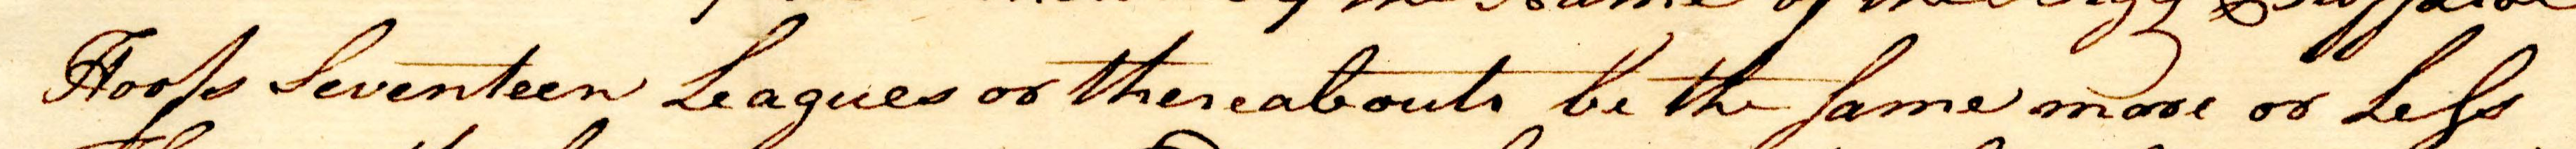Hoofs Seventeen Leagues or thereabouts be the same more or Less
